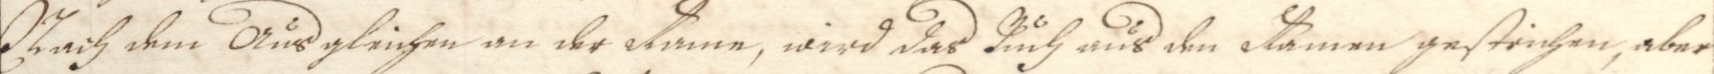Nach dem Ausgleichen an der Rame, wird das Tuch aus den Ramen gestrichen, aber
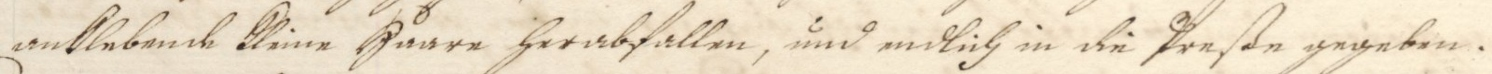anklebende kleine Haare herabfallen, und endlich in die Preße gegeben.
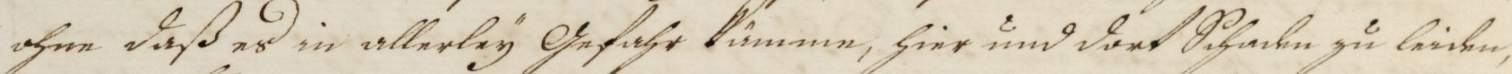ohne daß es in allerley Gefahr kämme, hier und dort Schaden zu leiden,
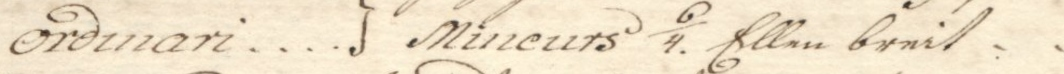Ordinari..... Mineurs 6/4. Ellen breit.
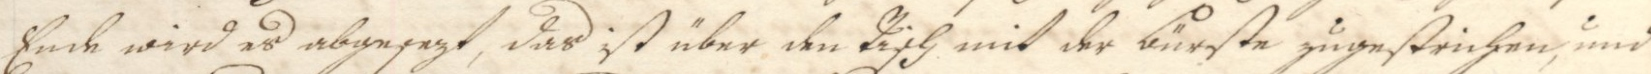Ende wird es abgesezt, das ist über den Tisch mit der Bürste zugestrichen, und
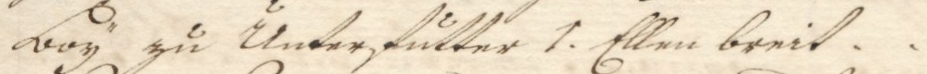Boy zu Unterfutter 1. Ellen breit.
